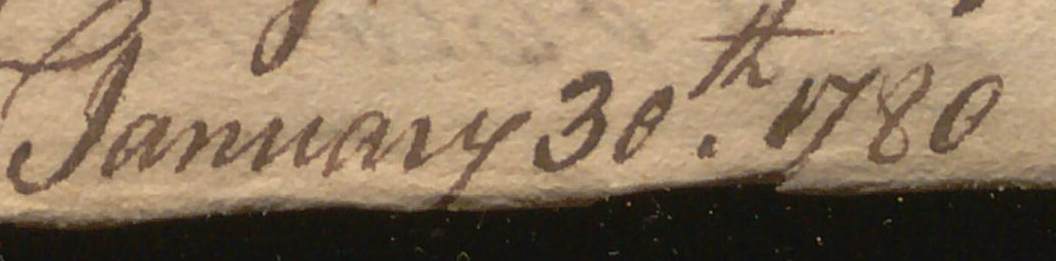January 30^th. 1780
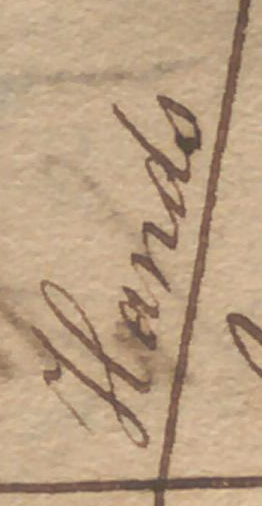Hands
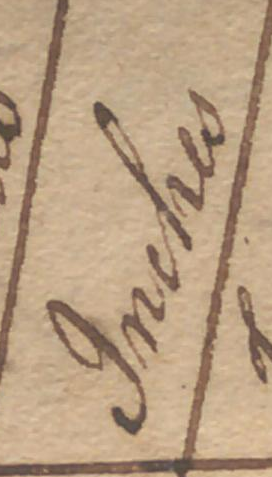Inches
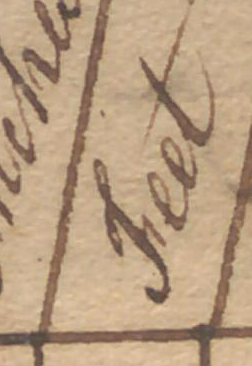Feet
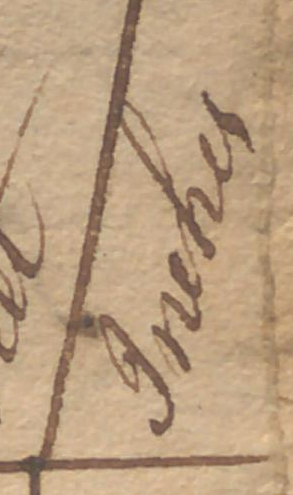Inches
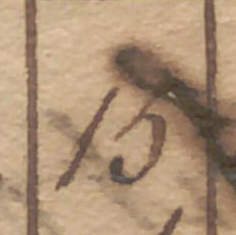15
